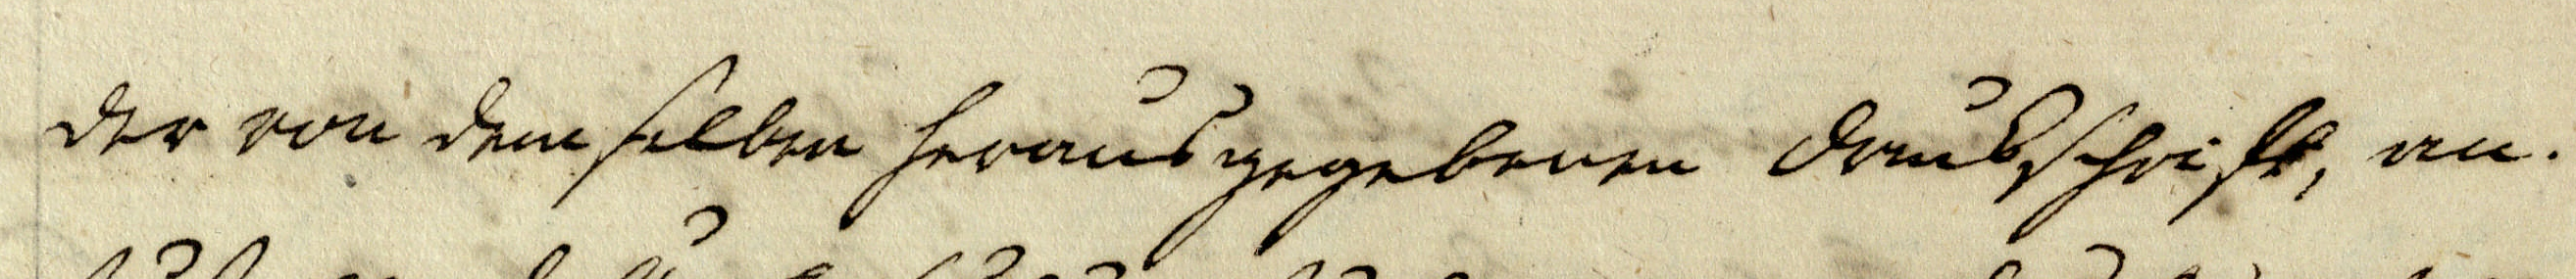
der von dem selben herausgegebenen Drukschrift, an¬
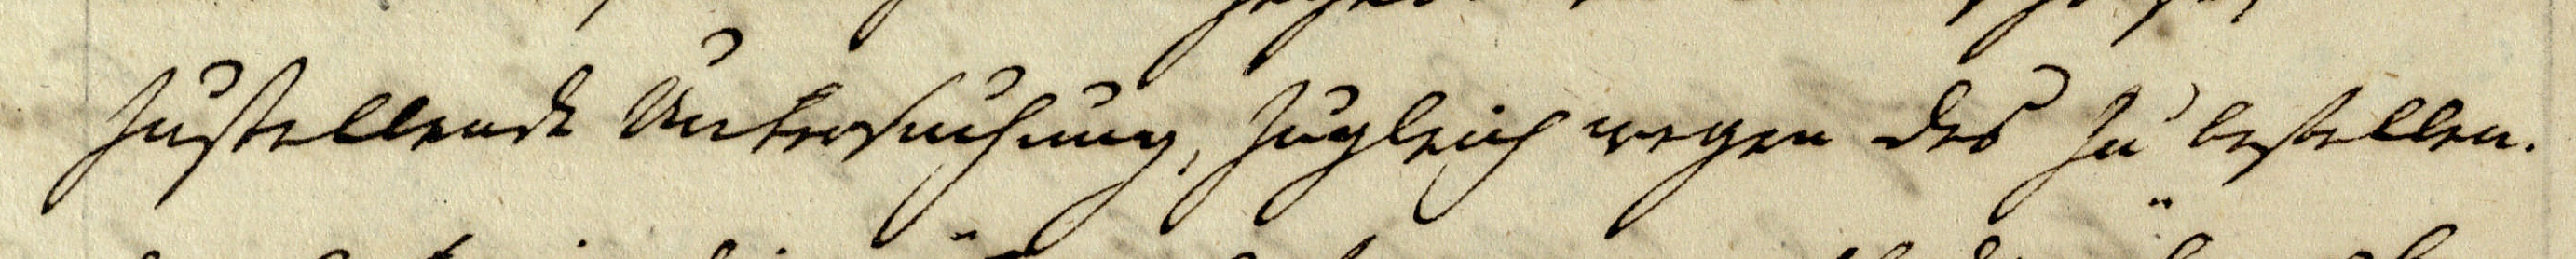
zustellende Untersuchung, zugleich wegen des zu bestellen¬
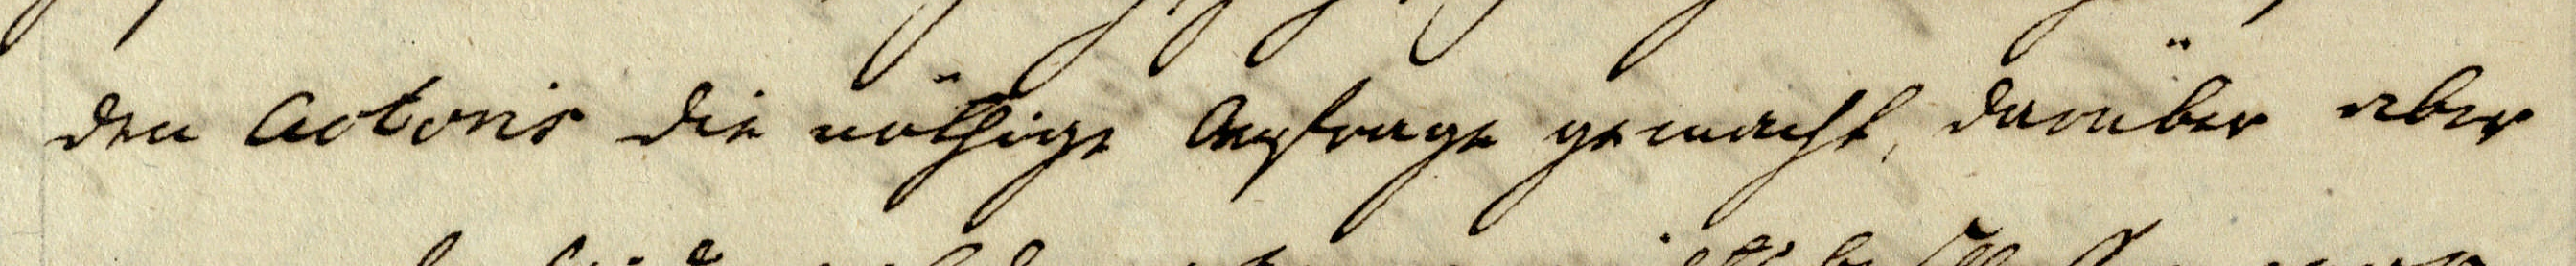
den Actoris die nöthige Anfrage gemacht, darüber aber
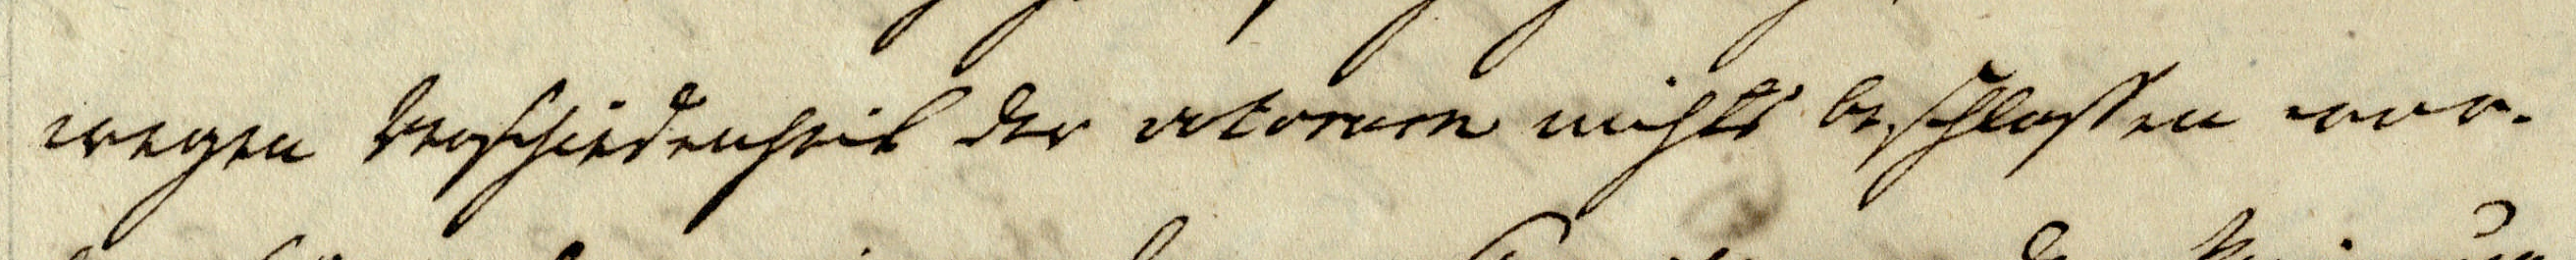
wegen Verschiedenheit der votorum nichts beschlossen wor¬
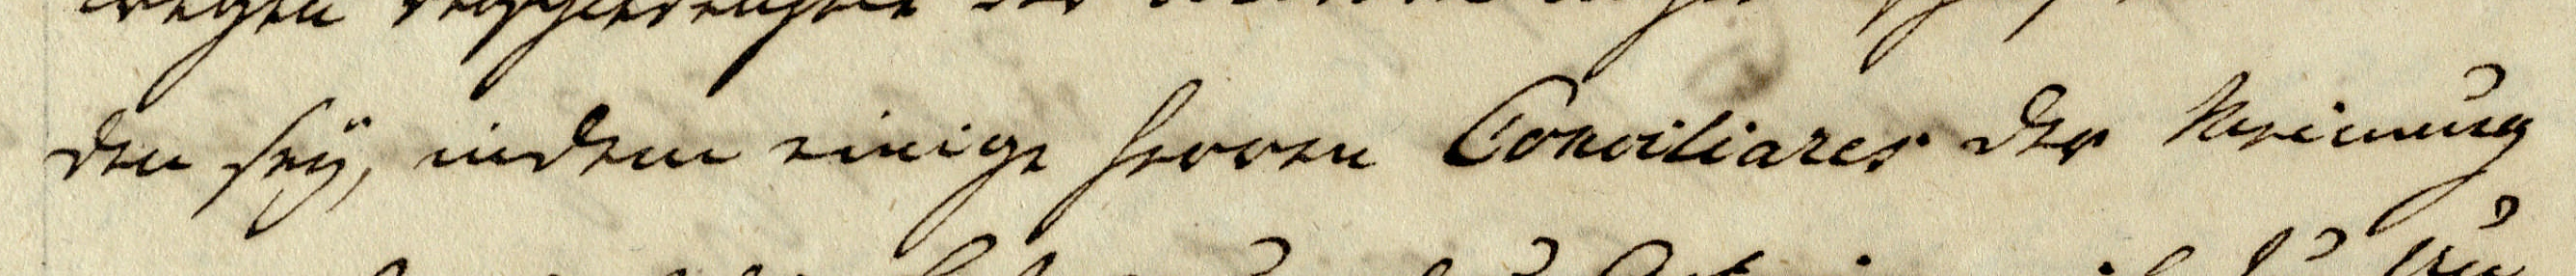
den seÿ, indem einige Herren Conciliares der Meinung
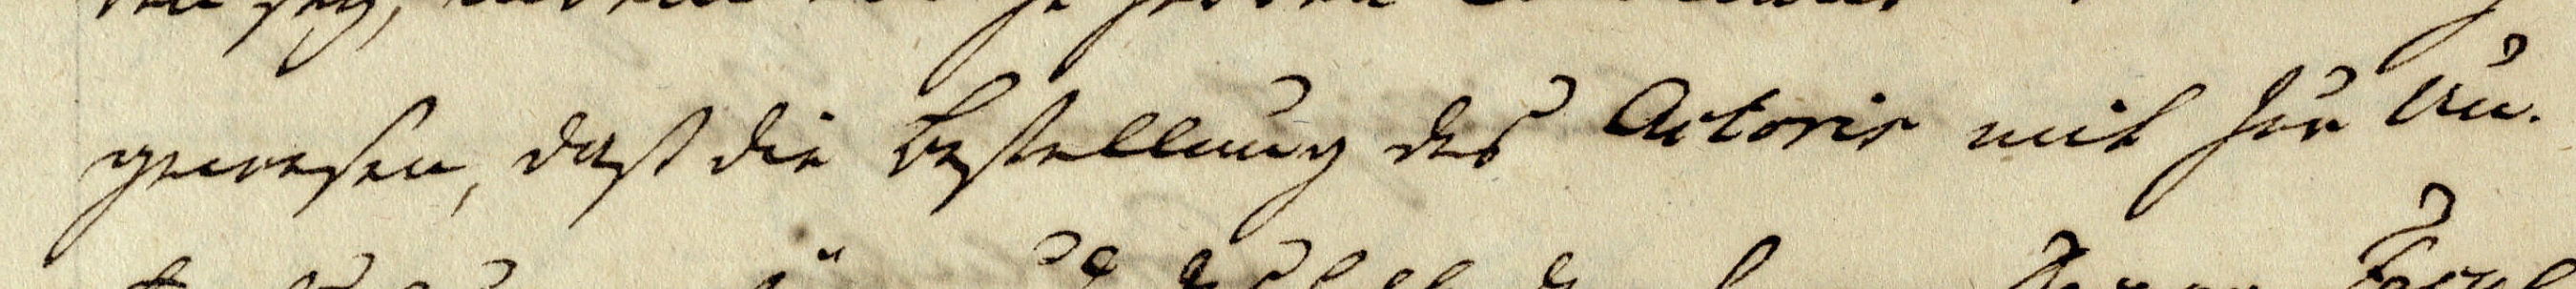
gewesen, daß die Bestellung des Actoris mit zur Un¬
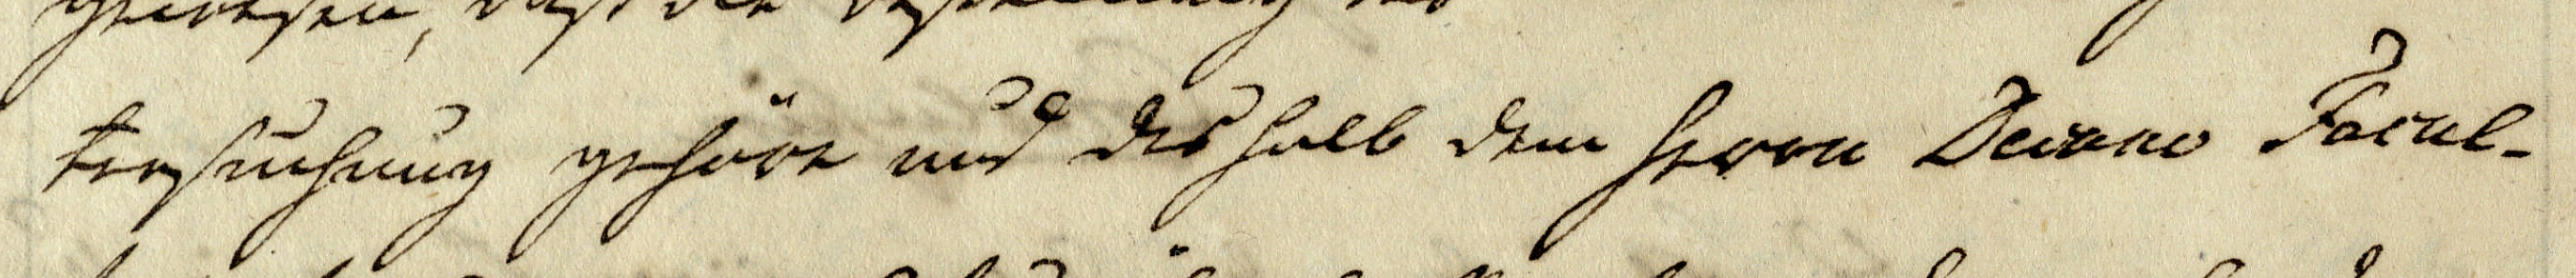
tersuchung gehöre und deshalb dem Herrn Decano Facul¬
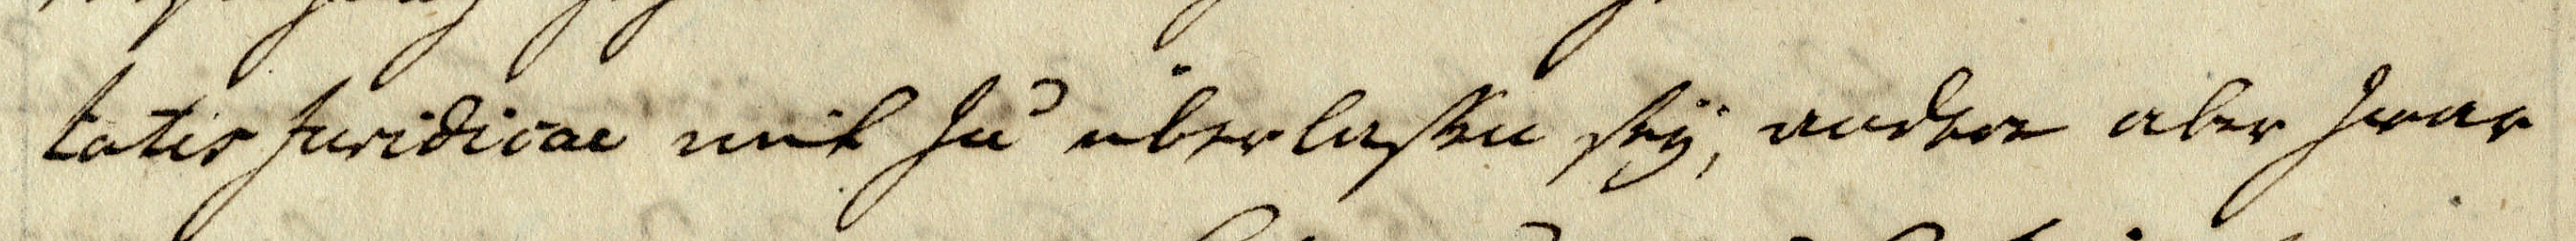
tatis Juridicae mit zu überlassen seÿ, andere aber zwar
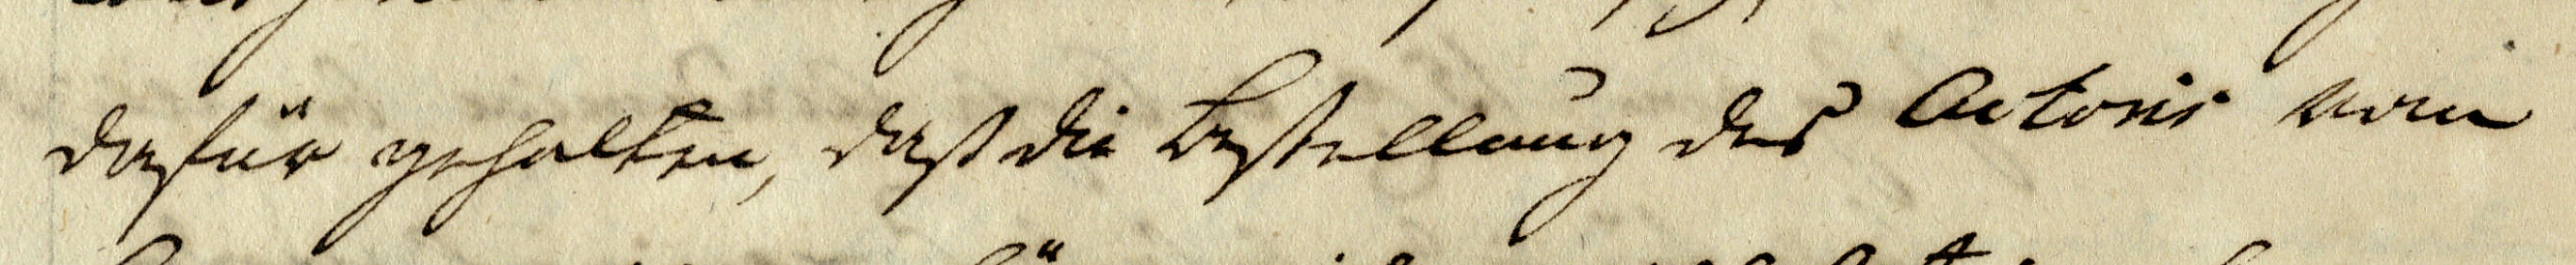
dafür gehalten, daß die Bestellung des Actoris vom
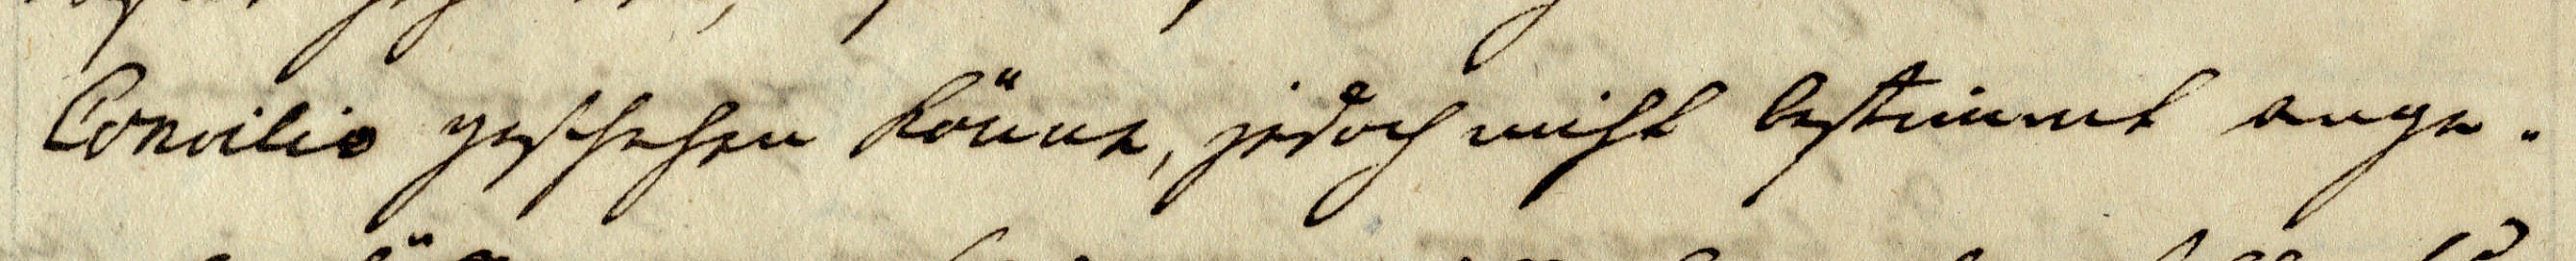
Concilio geschehen könne, jedoch nicht bestimmt ange¬
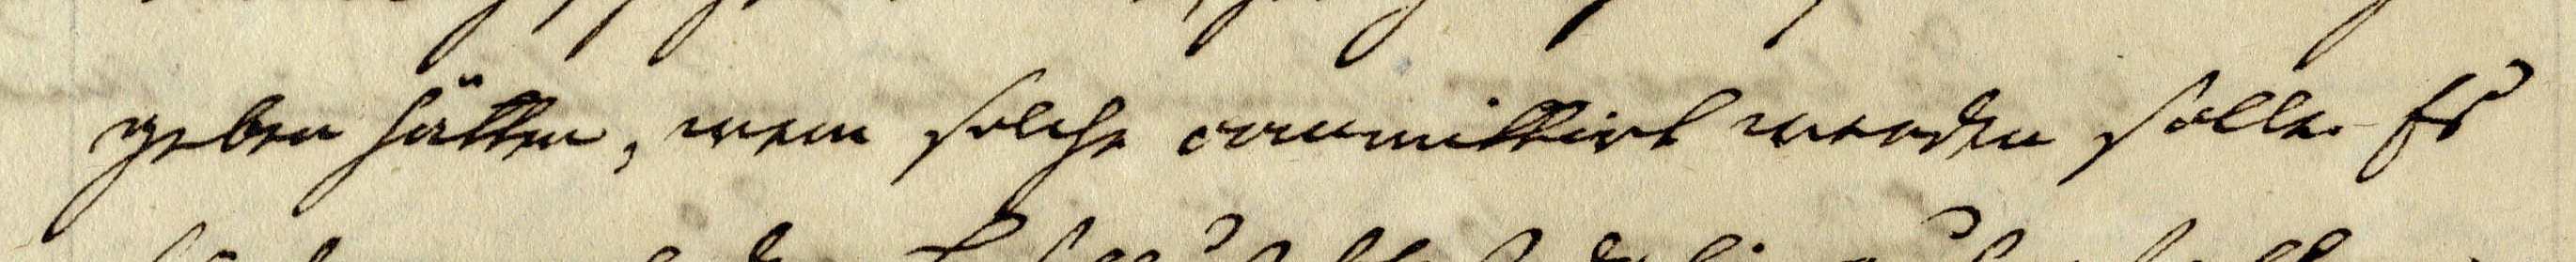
geben hätten, wem solche committirt werden solle. Es
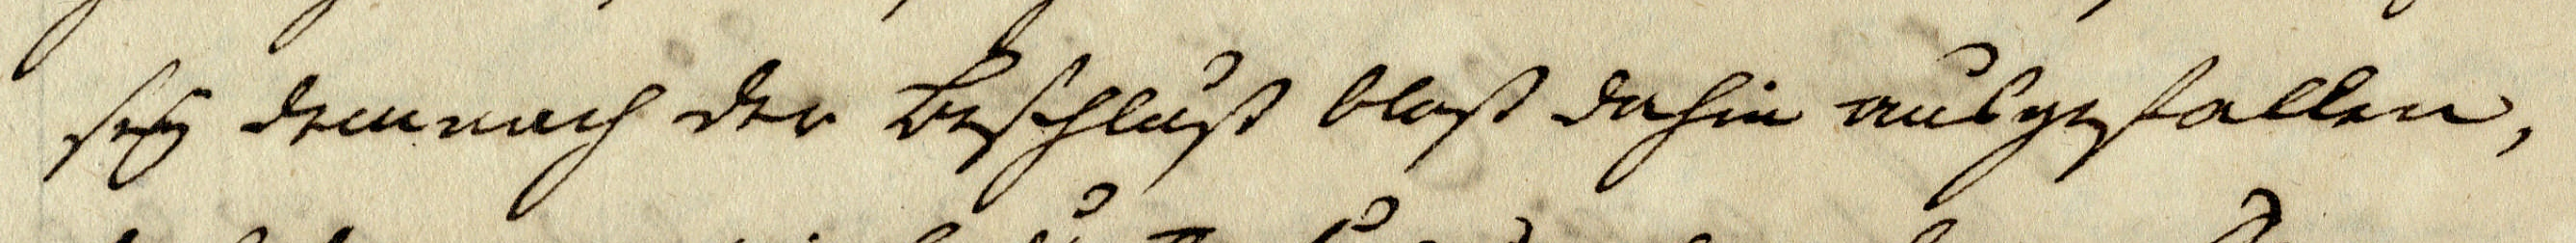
seÿ demnach der Beschluß bloß dahin ausgefallen,
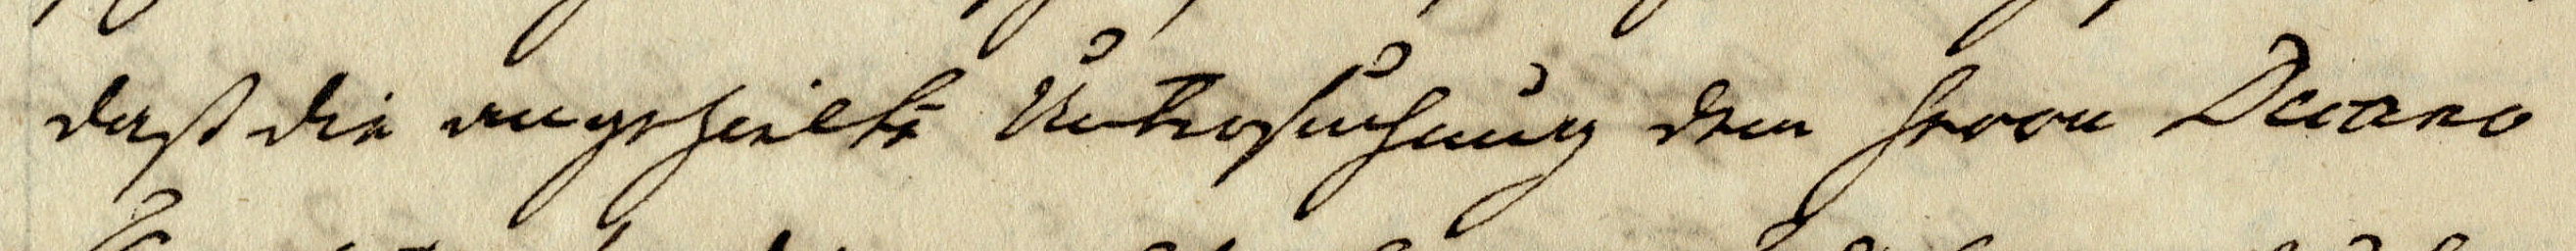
daß die angezielte Untersuchung dem Herrn Decano
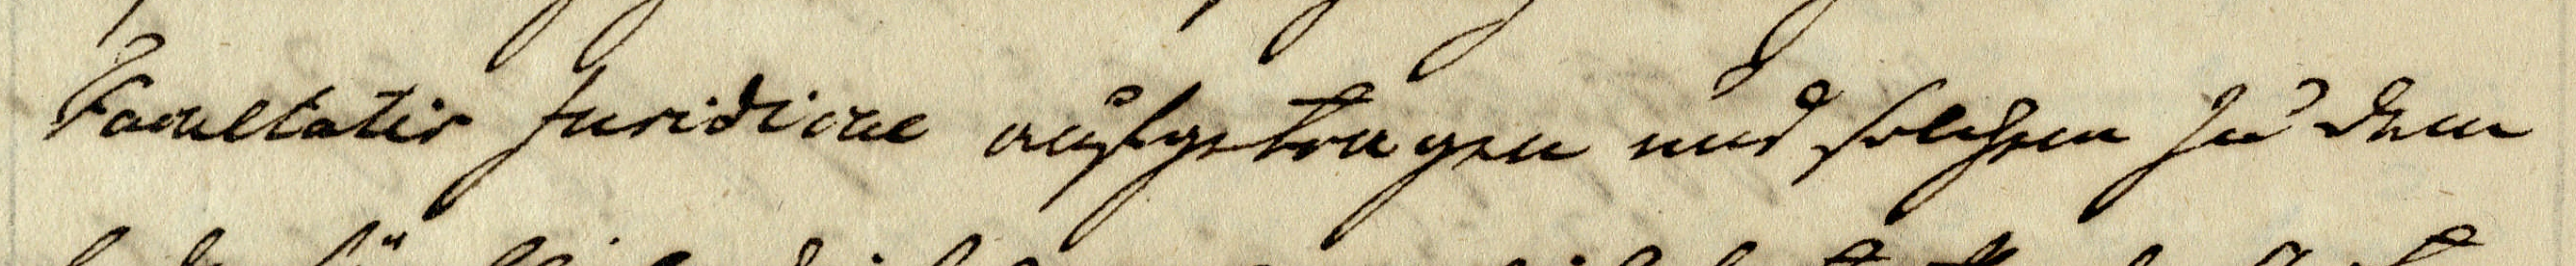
Facultatis Juridicae aufgetragen und solchem zu dem
